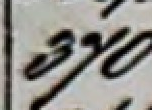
370
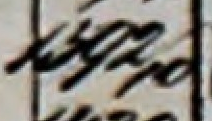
1392,0
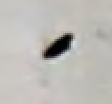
„
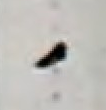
„
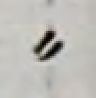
„
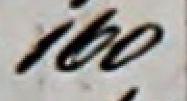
160
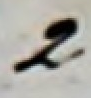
2
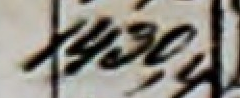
1430,4
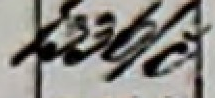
1336/c
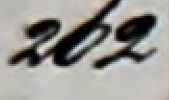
262
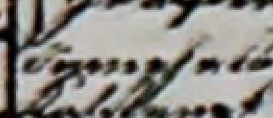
J???halb
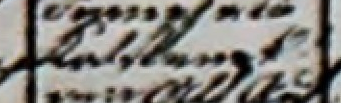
Katsberg k.
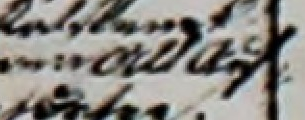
??? Alt Aus„
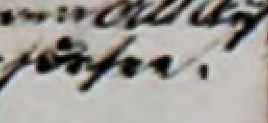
seeser.
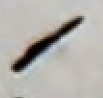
1
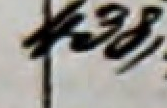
438,4
